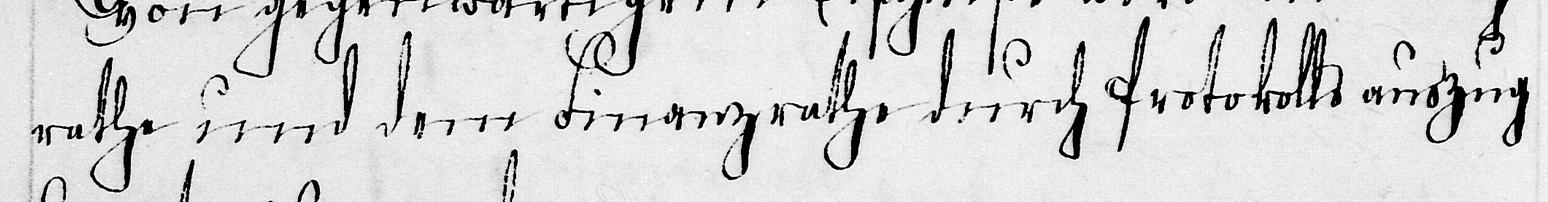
rathe und dem Finanzrathe durch Protokollsauszug
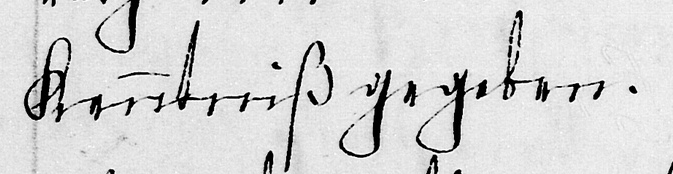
Kenntniß gegeben.
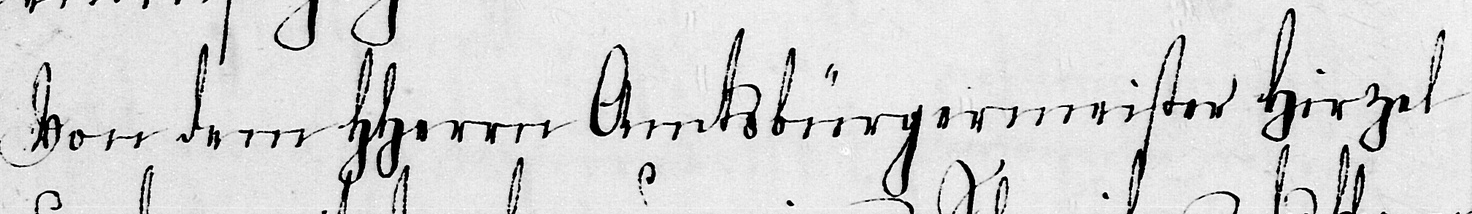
Von dem HHerrn Amtsbürgermeister Hirzel
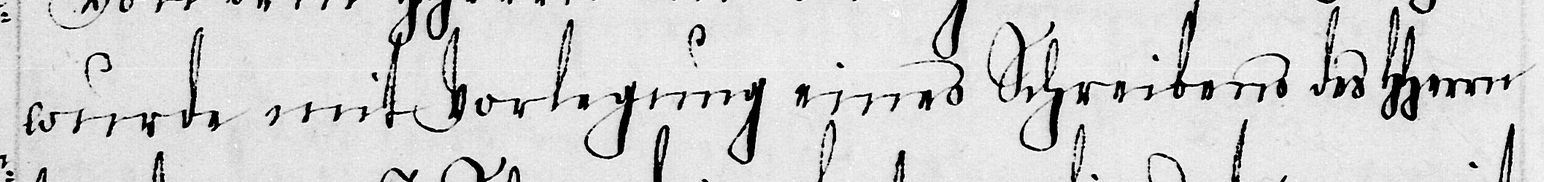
wurde mit Vorlegung eines Schreibens des HHerrn
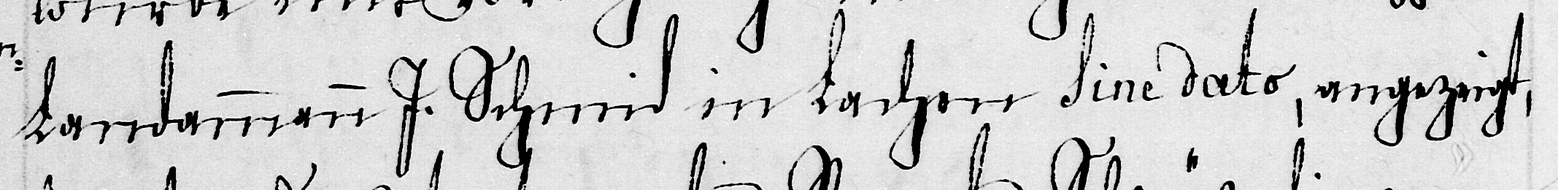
Landammann J. Schmid in Lachen sine dato, angezeigt,
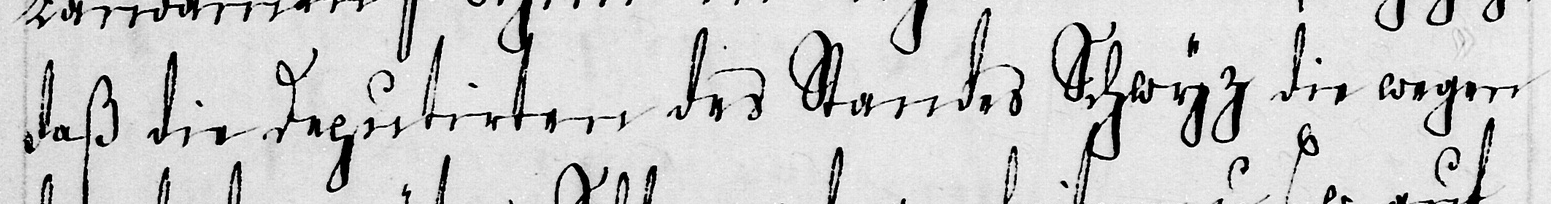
daß die Deputirten des Standes Schwyz die wegen
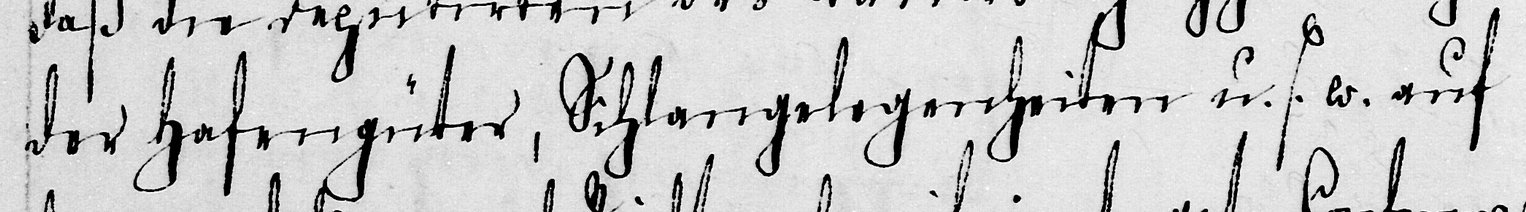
der Hafengüter, Sihlangelegenheiten u. s. w. auf
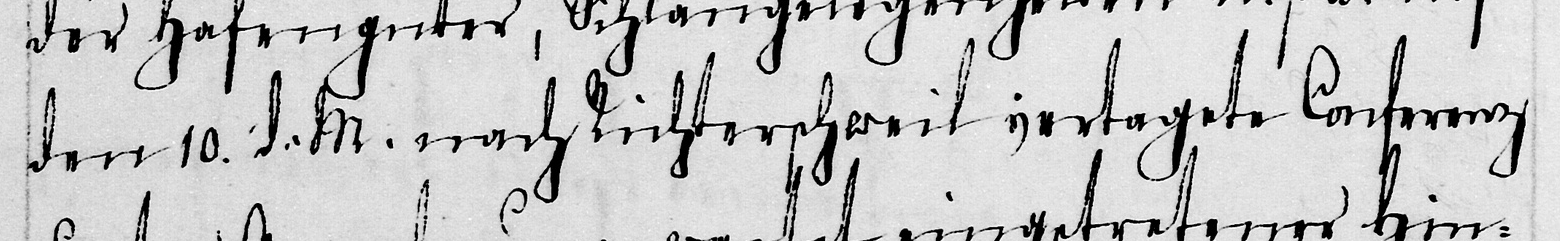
den 10. d. M. nach Richterschweil vertagete Conferenz
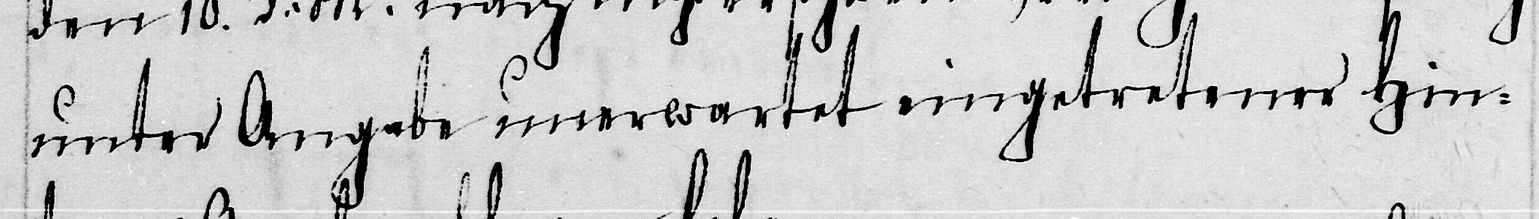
unter Angabe unerwartet eingetretener Hin¬
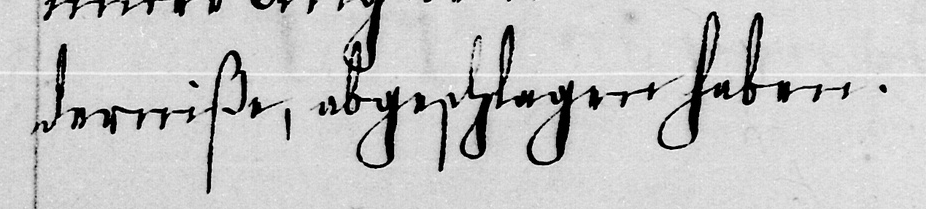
derniße, abgeschlagen haben.
